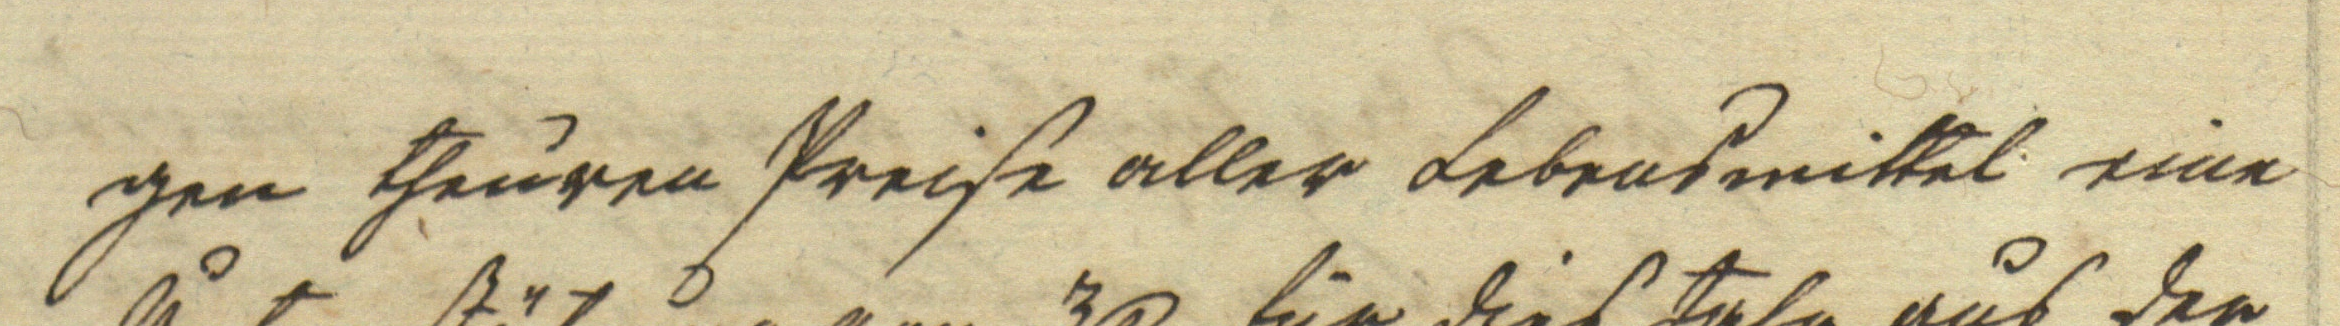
gen theuren Preise aller Lebensmittel eine
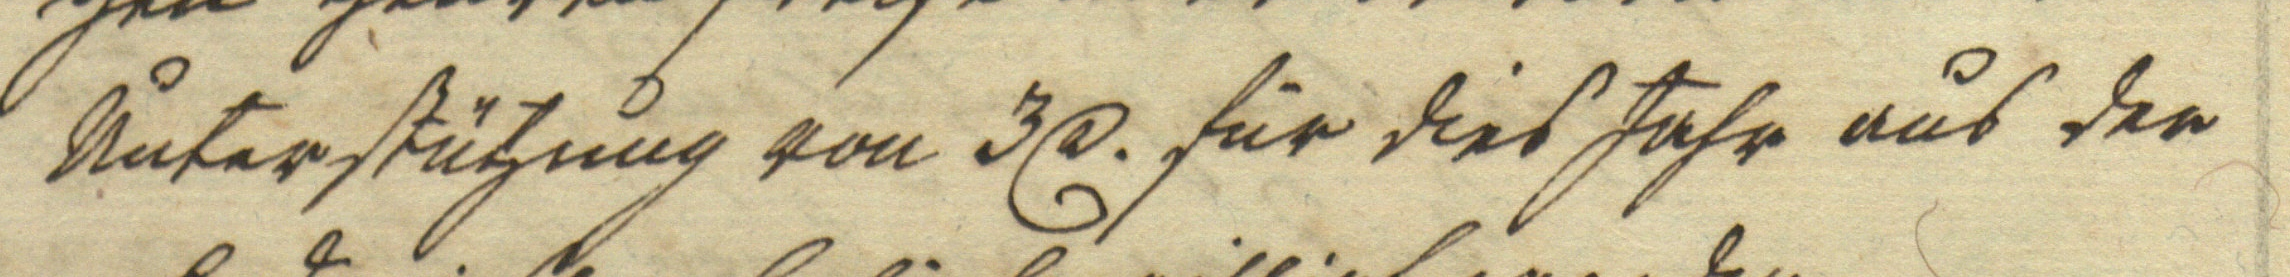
Unterstützung von 3 l. für dies Jahr aus der
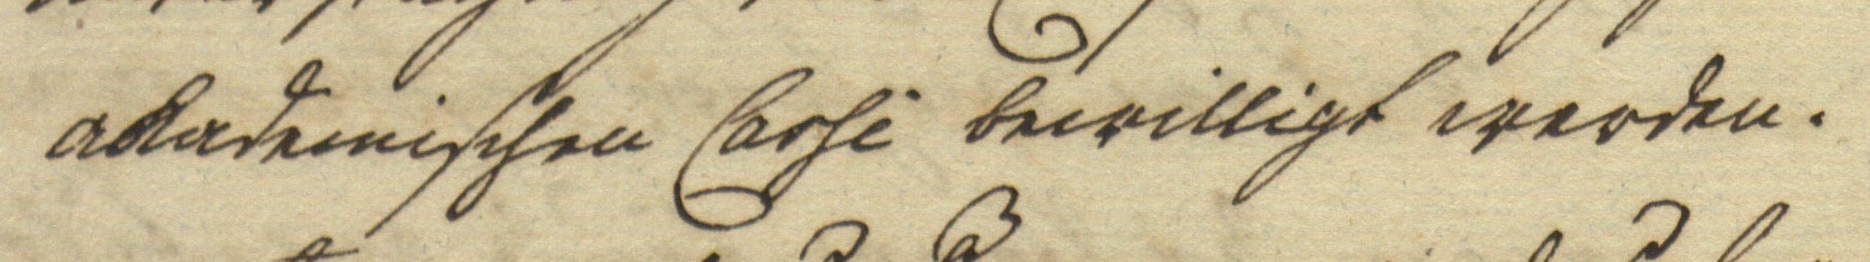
akademischen Casse bewilligt werden.
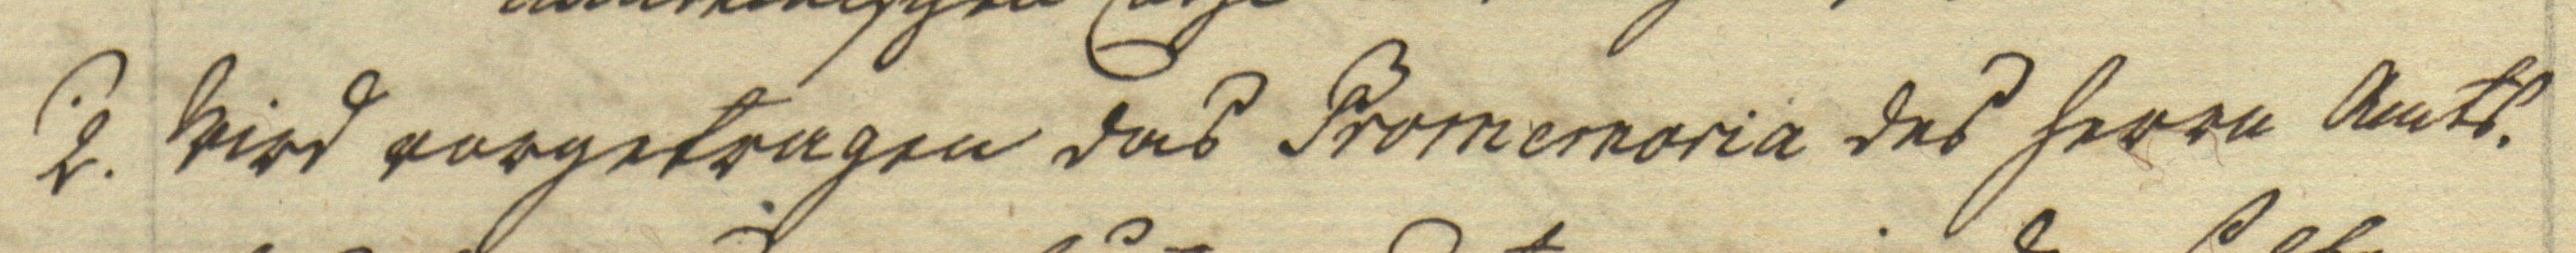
2. Wird vorgetragen das Promemoria des Herrn Amts¬
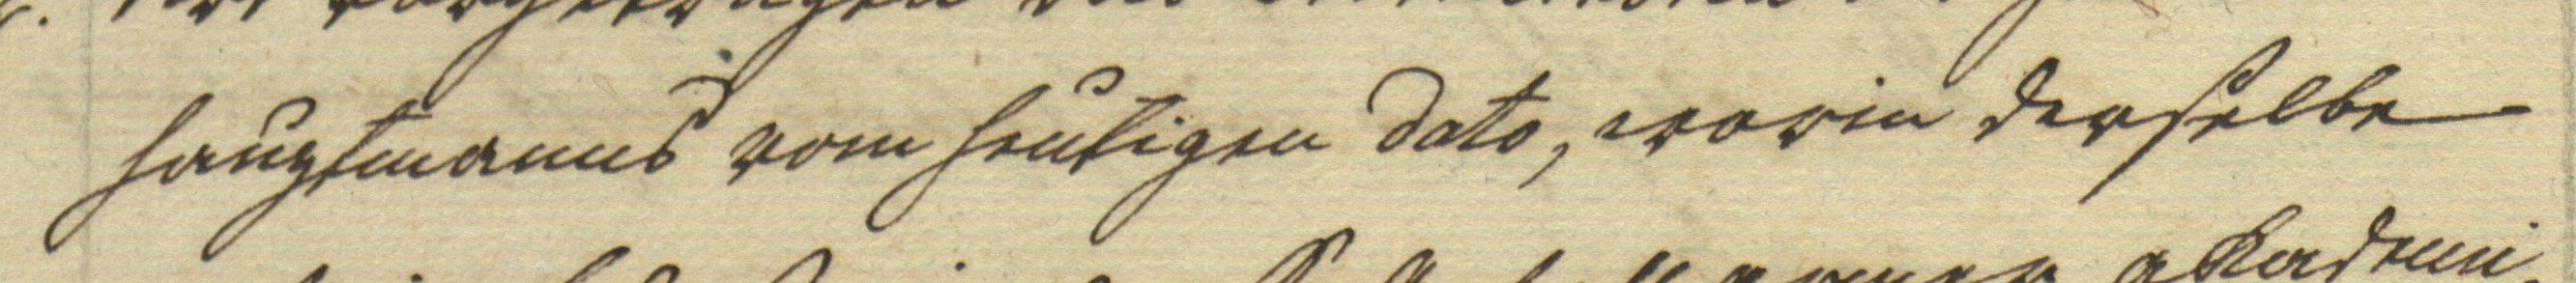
hauptmanns vom heutigen dato, worin derselbe
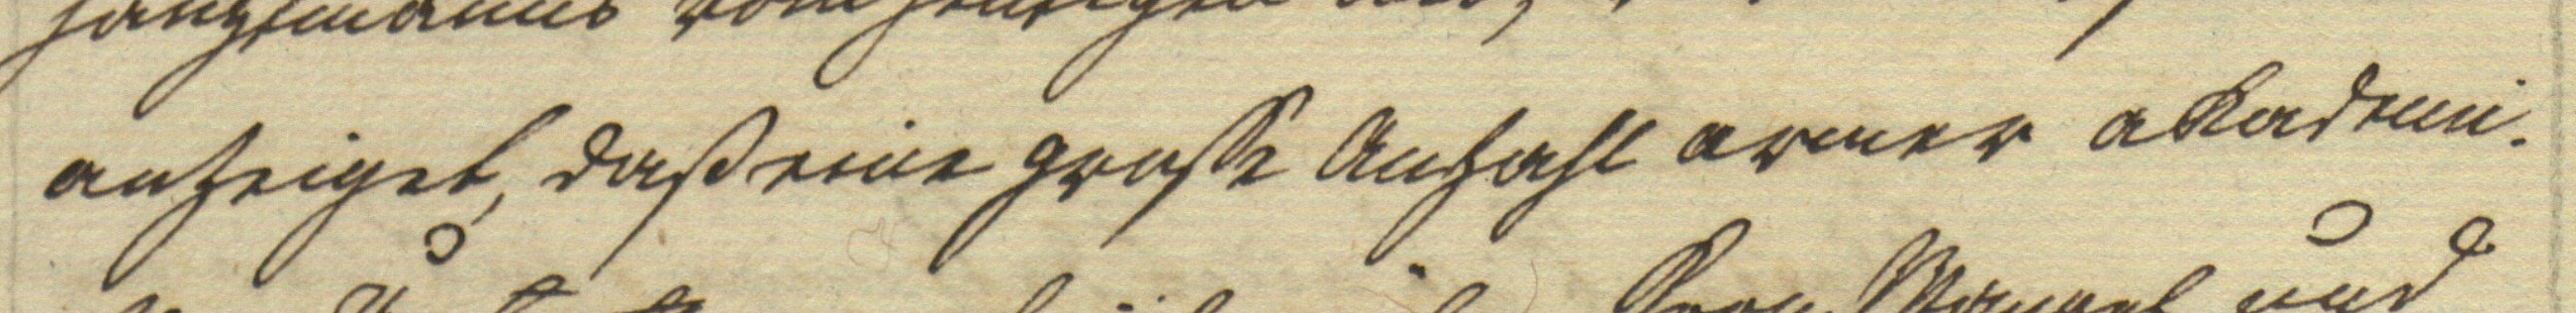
anzeiget, daß eine grosse Anzahl armer akademi¬
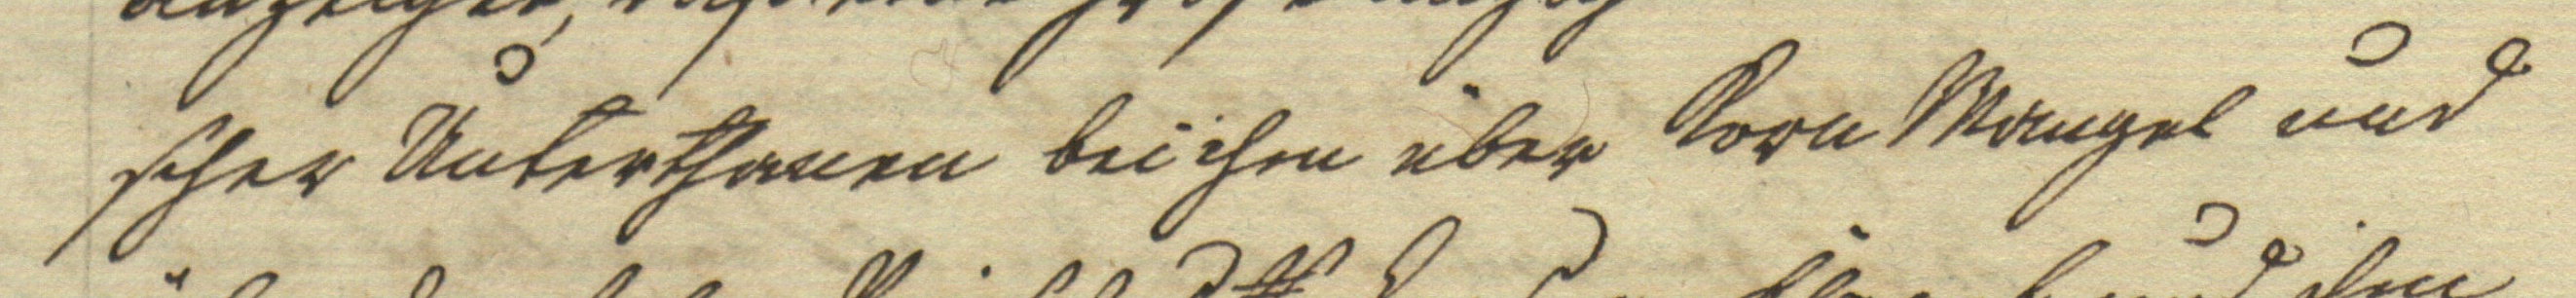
scher Unterthanen bei ihm über Korn Mangel und
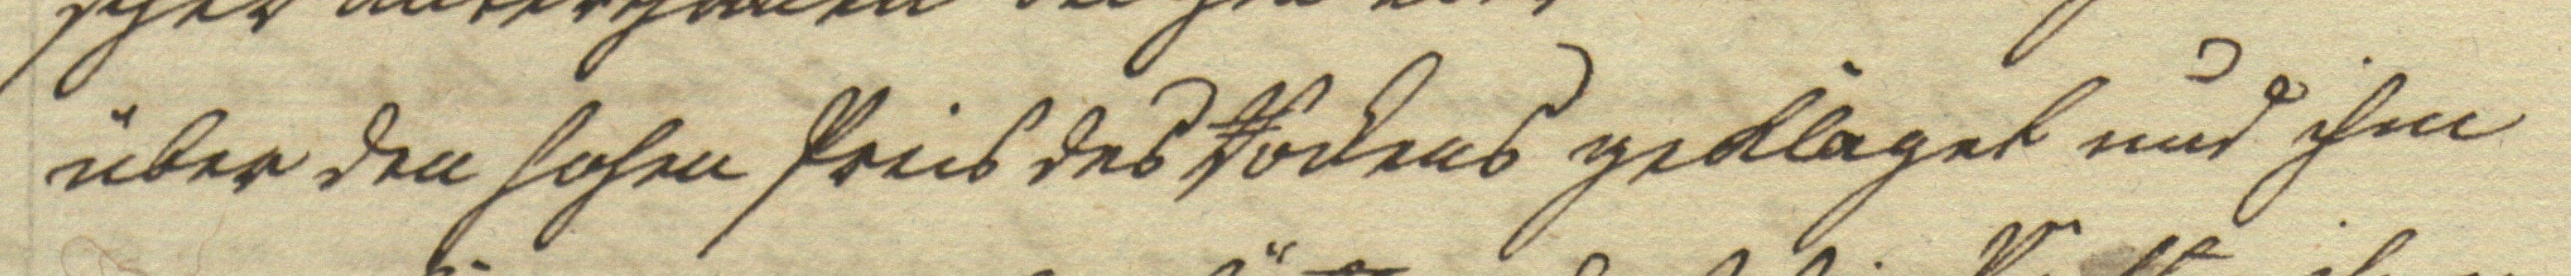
über den hohen Preis des Rockens geklaget und ihm
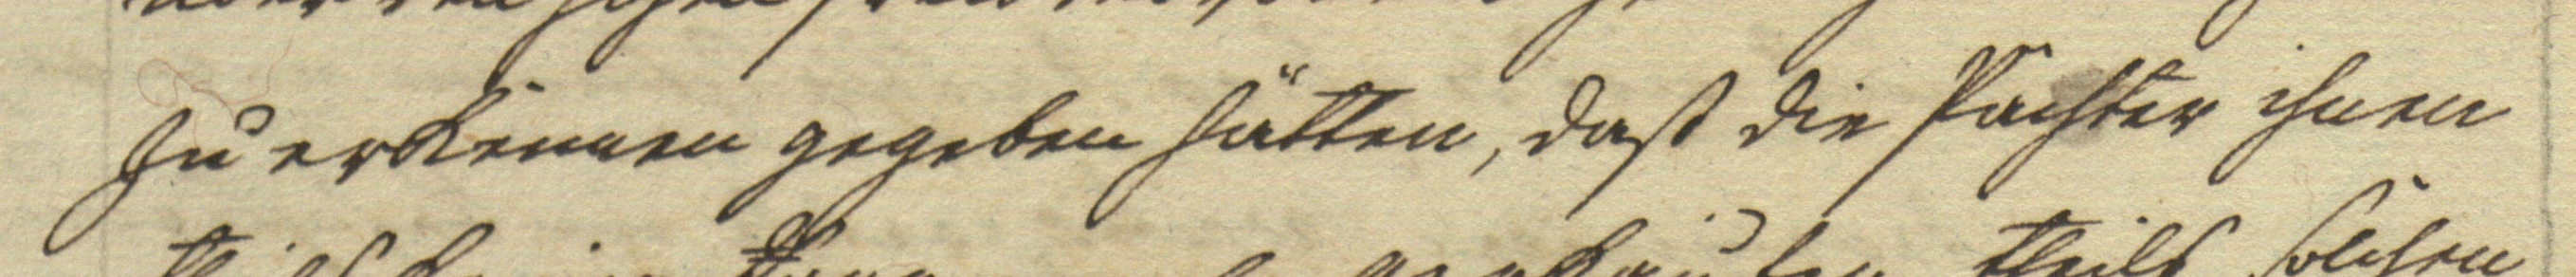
zu erkennen gegeben hätten, daß die Pächter ihnen
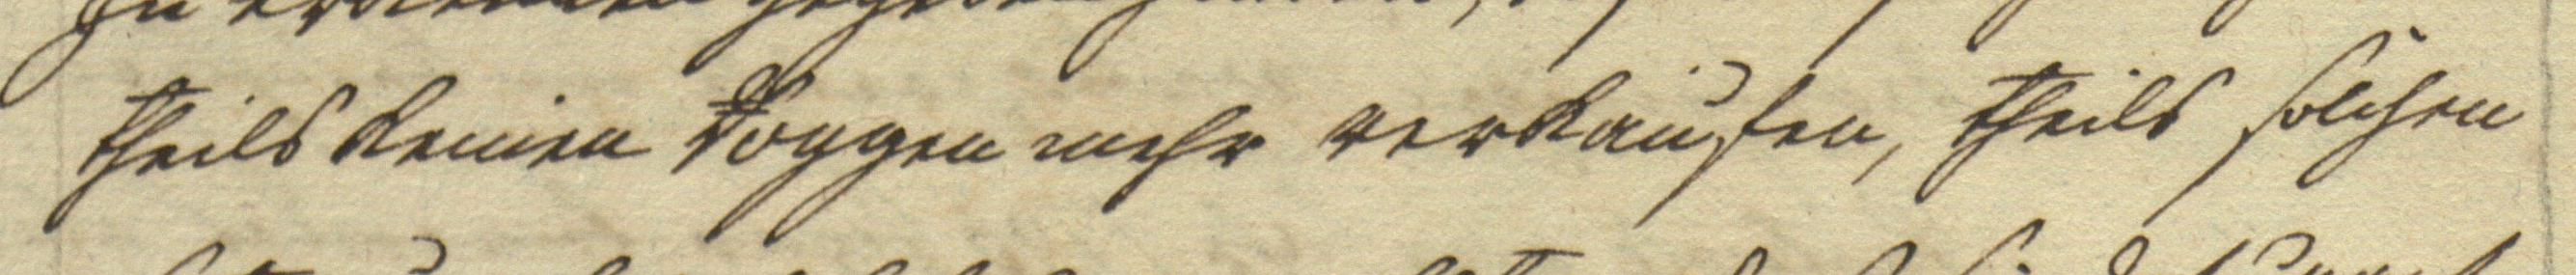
theils keinen Roggen mehr verkaufen, theils solchen
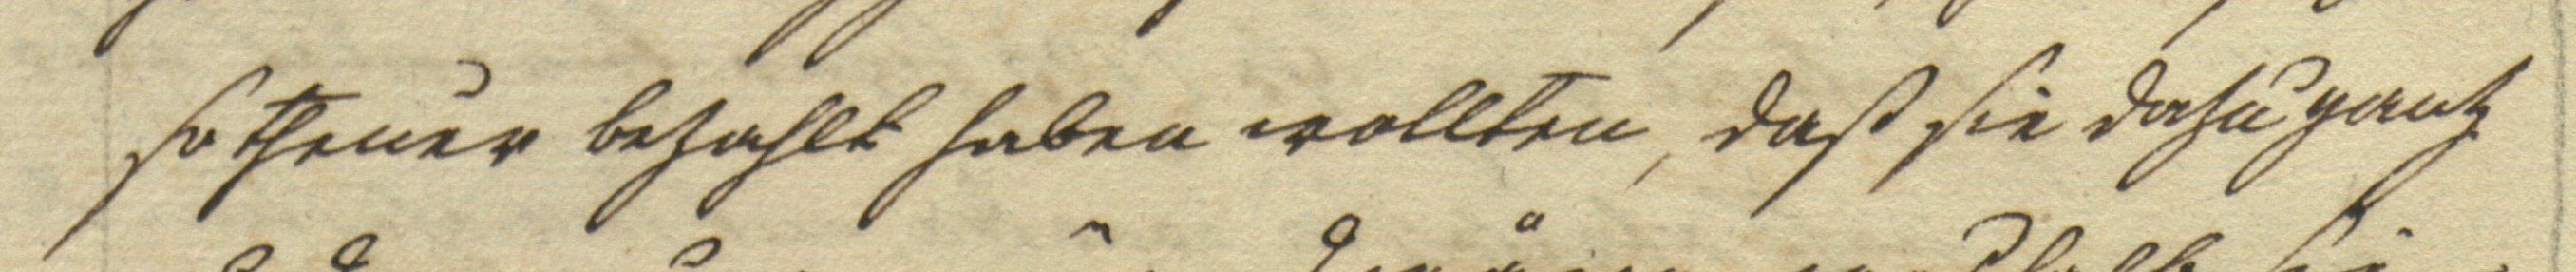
so theuer bezahlt haben wollten, daß sie dazu gantz
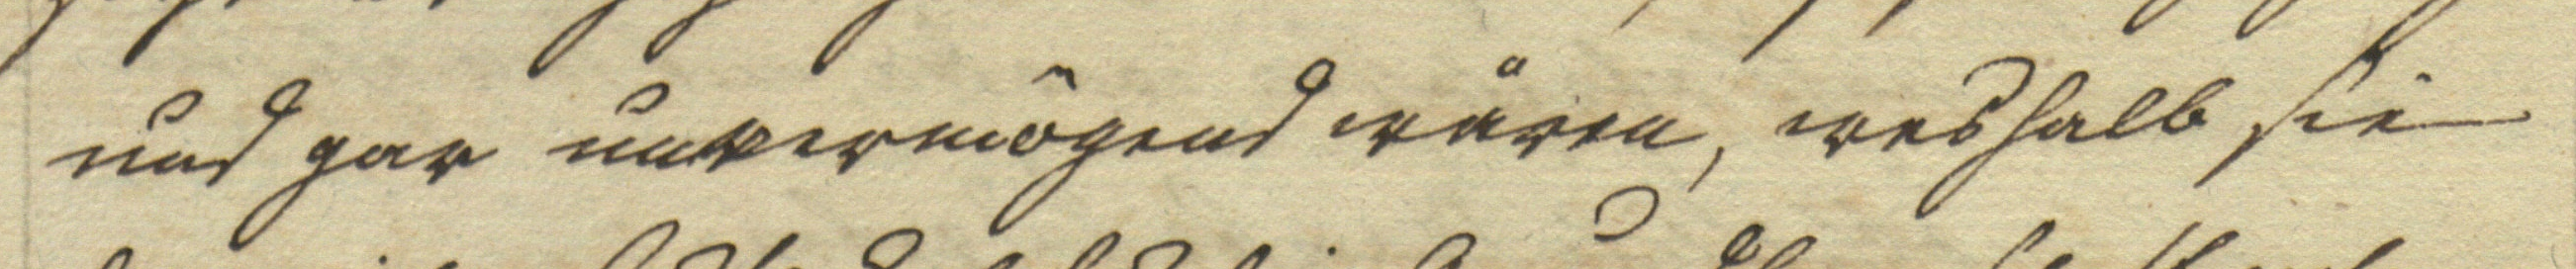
und gar unvermögend wären, weshalb sie
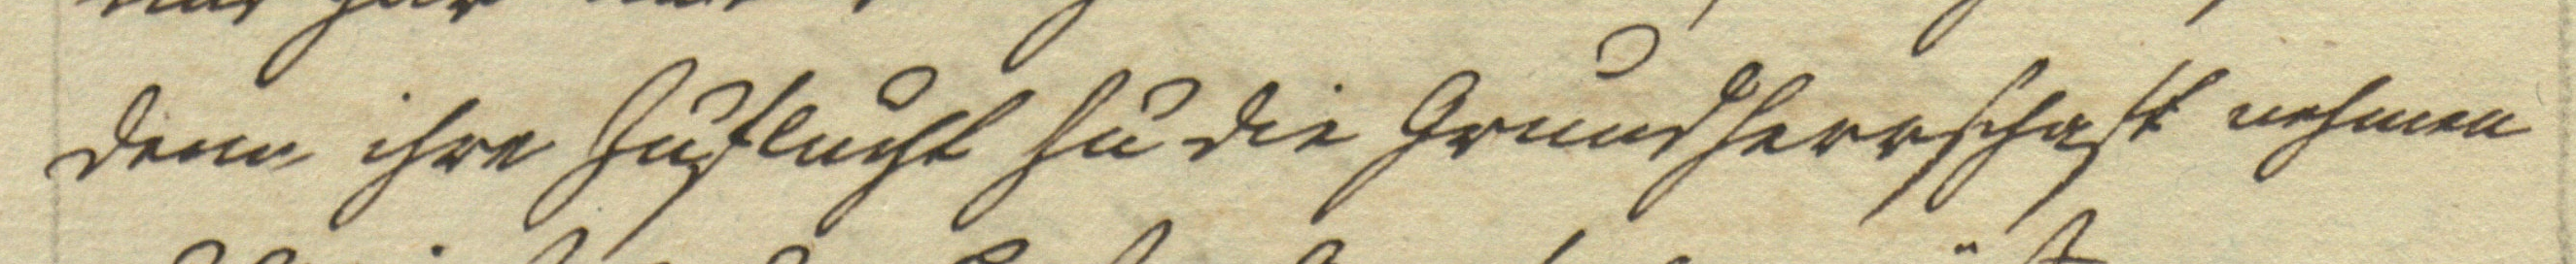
denn ihre Zuflucht zu die Grundherrschaft nehmen
